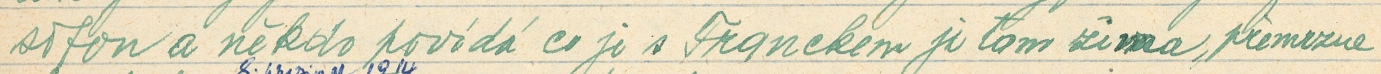sifon a někdo povídá co je s Franckem je tam zima, přemrzne
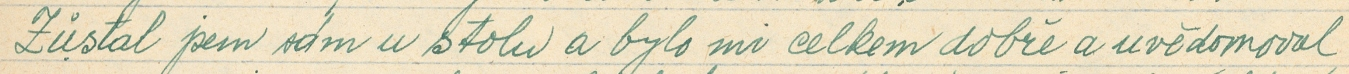Zůstal jsem sám u stolu a bylo mi celkem dobře a uvědomoval
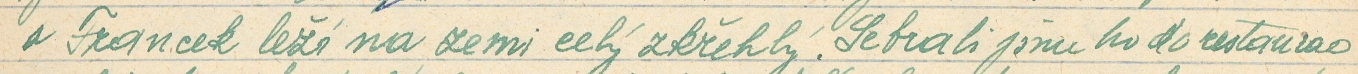a Francek leží na zemi celý zkřehlý. Sebrali jsme ho do restaurace
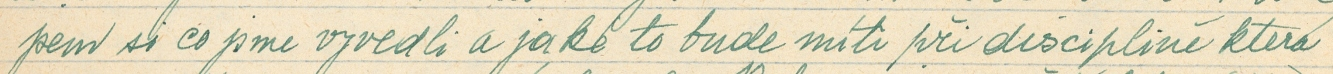jsem si co jsme vyvedli a jaké to bude míti při disciplině která
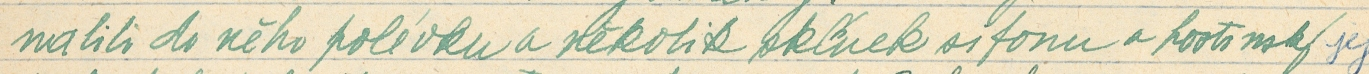nalili do něho polévku a několik sklenek sifonu a hostinský jej
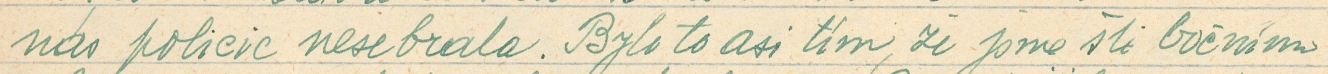nás policie nesebrala. Bylo to asi tím, že jsme šli bočními
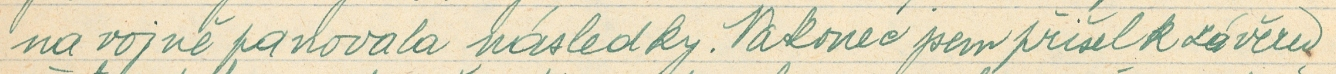na vojně panovala následky. Nakonec jsem přišel k závěru
